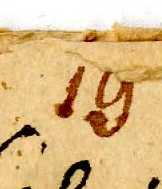19
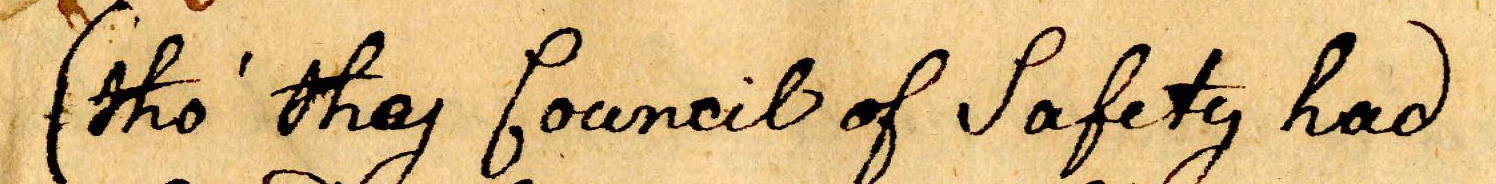(tho' thy Council of Safety had
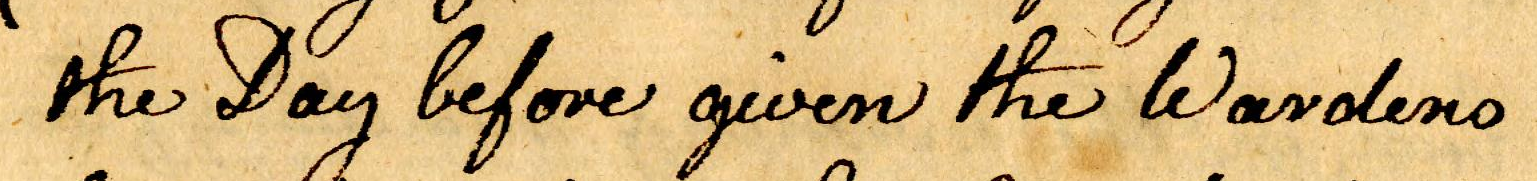the Day before given the Wardens
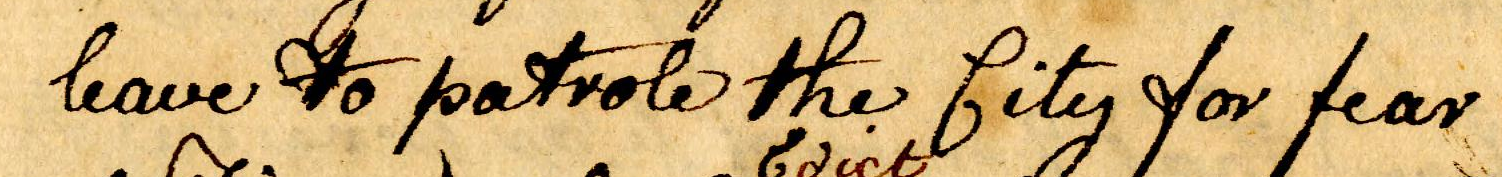leave to patrole the City for fear
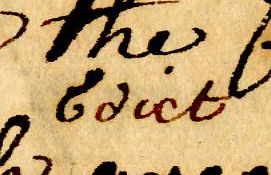Edict
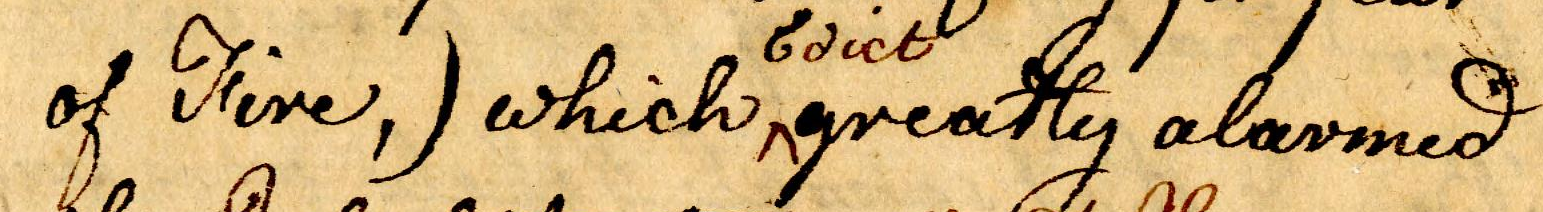of Fire,) which ^ greatly alarmed
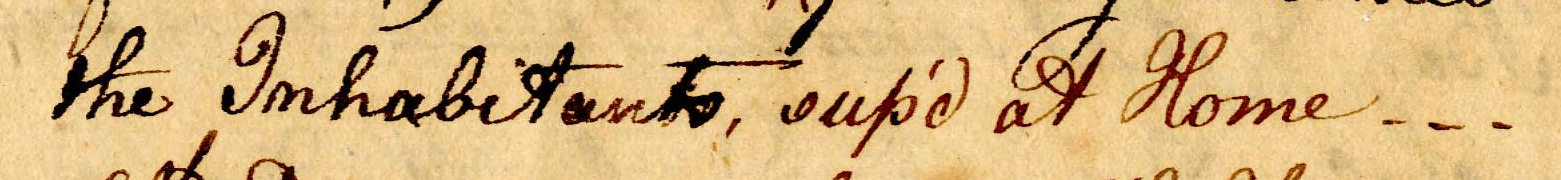the Inhabitants, sup'd at Home -
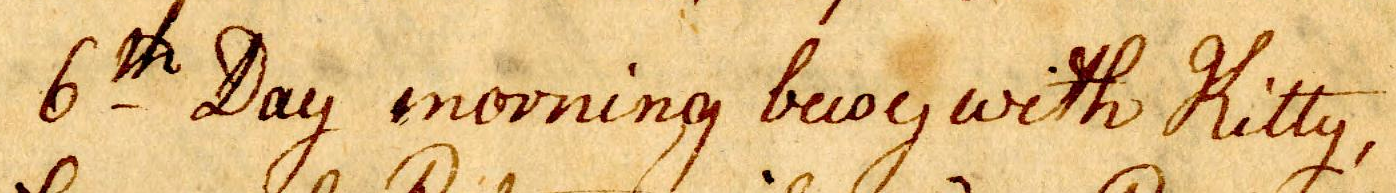6^th Day morning busy with Kitty,
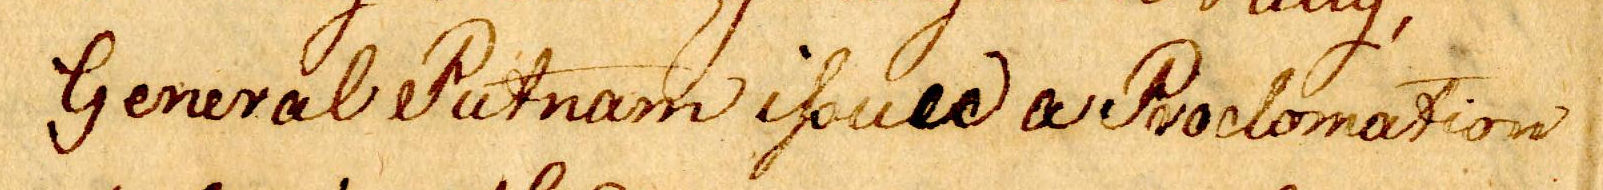General Putnam issued a Proclomation
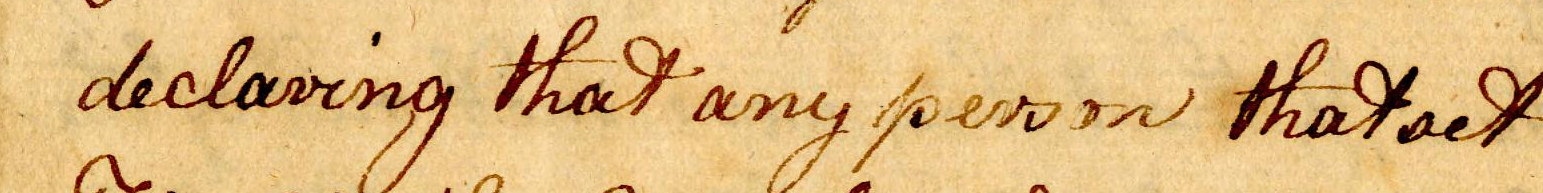declaring that any person that set
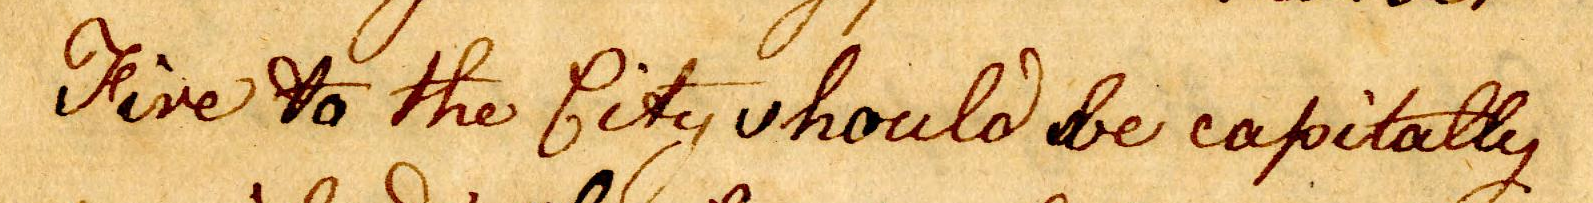Fire to the City should be capitally
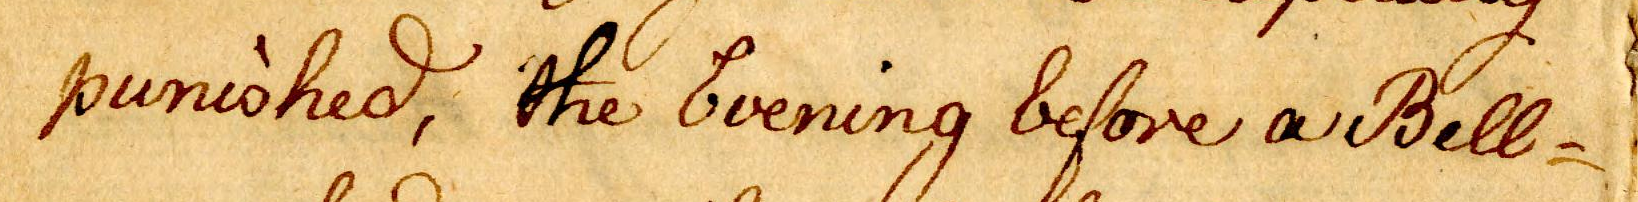punished, the Evening before a Bell-
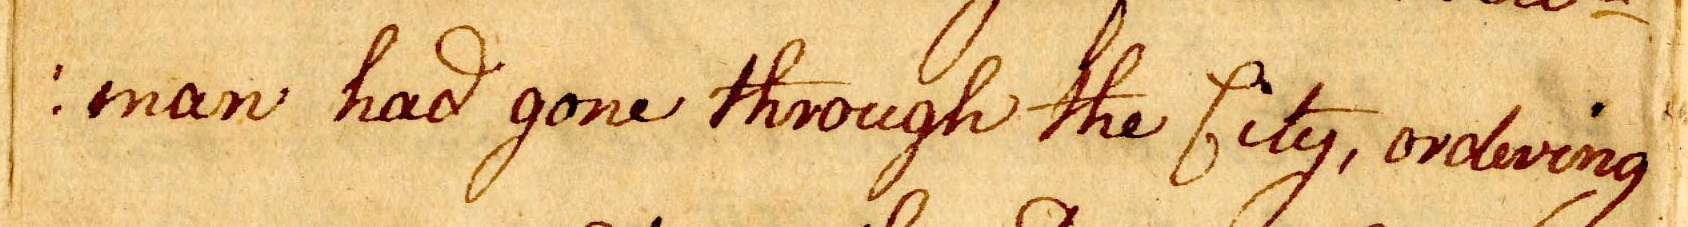-man had gone through the City, ordering
